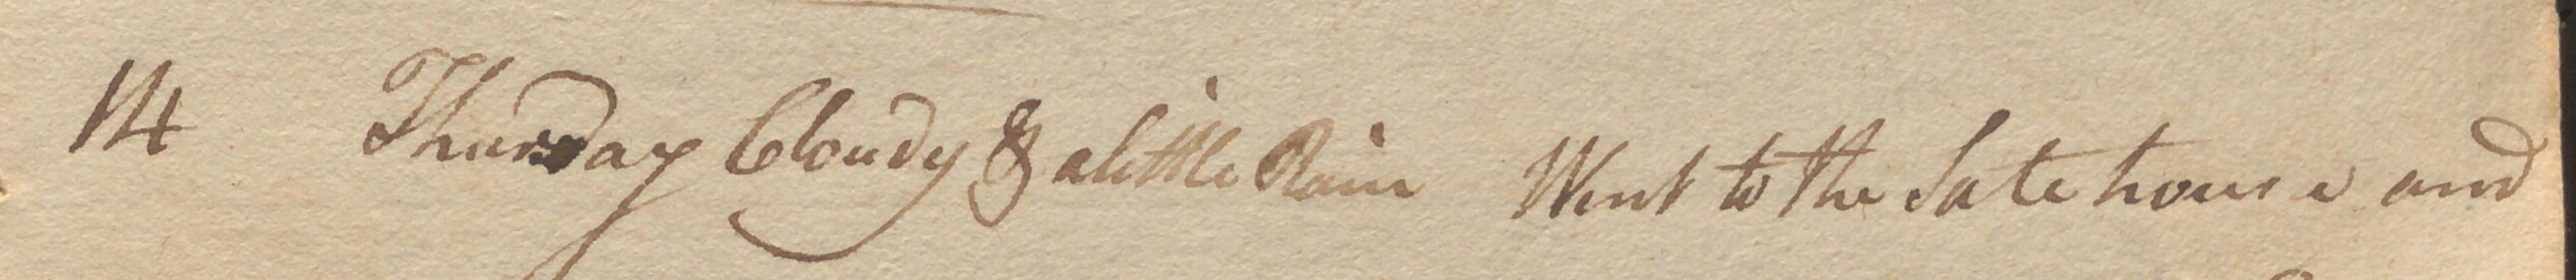14 Thurday Cloudy & a little Rain Went to the Sate house an
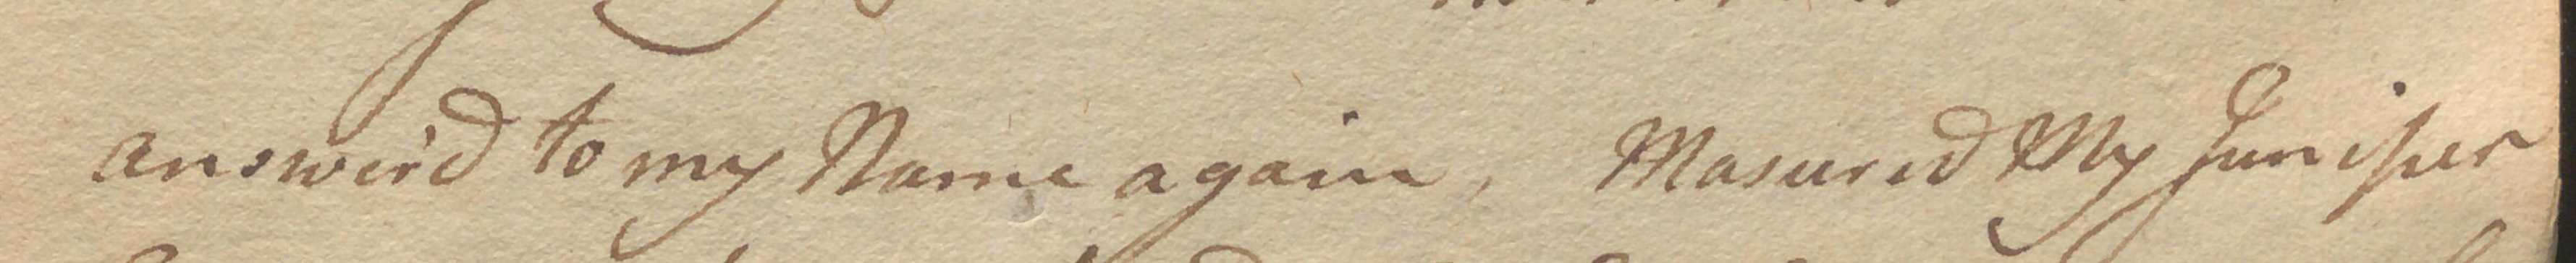answer'd to my Name again, Masured My Juniper
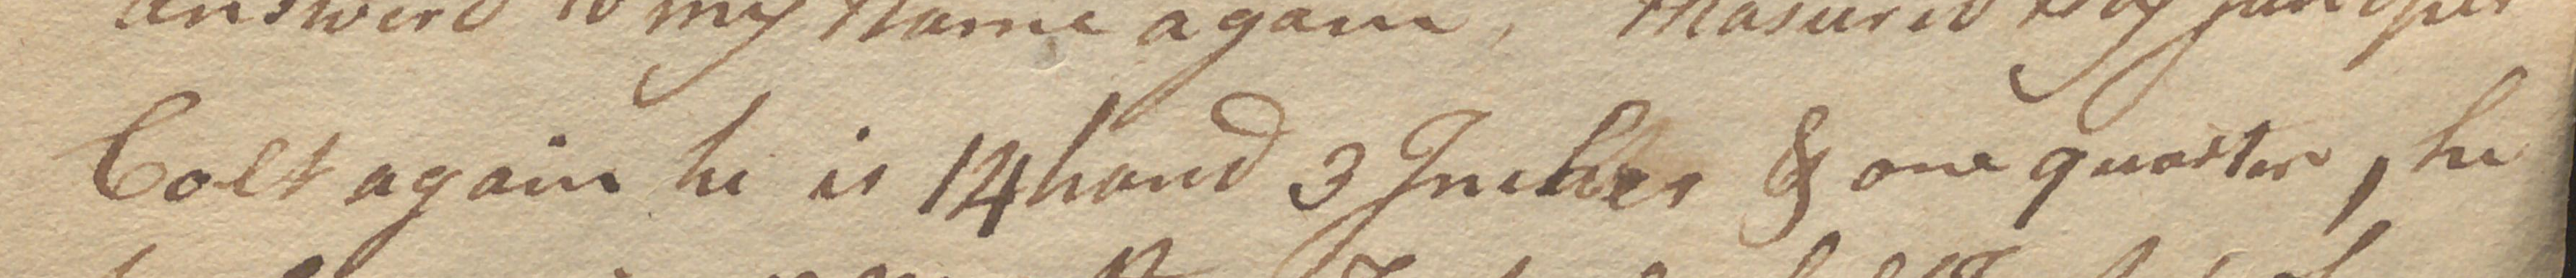Colt again he is 14 hand 3 Inches & one quarter, he
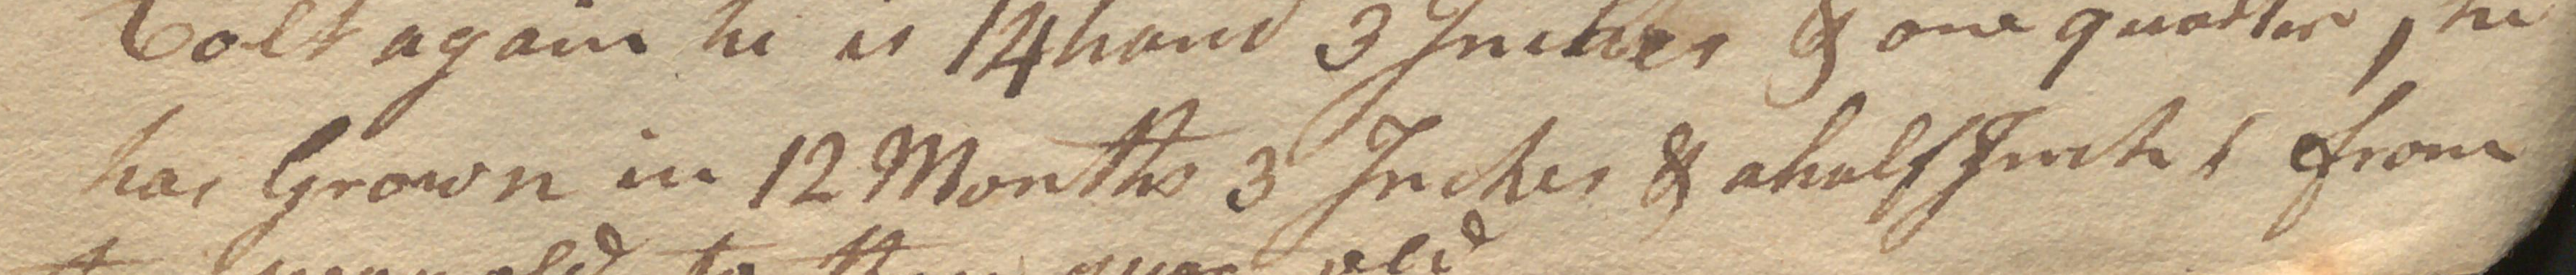has Grown in 12 Months 3 Inches & a half Inch from
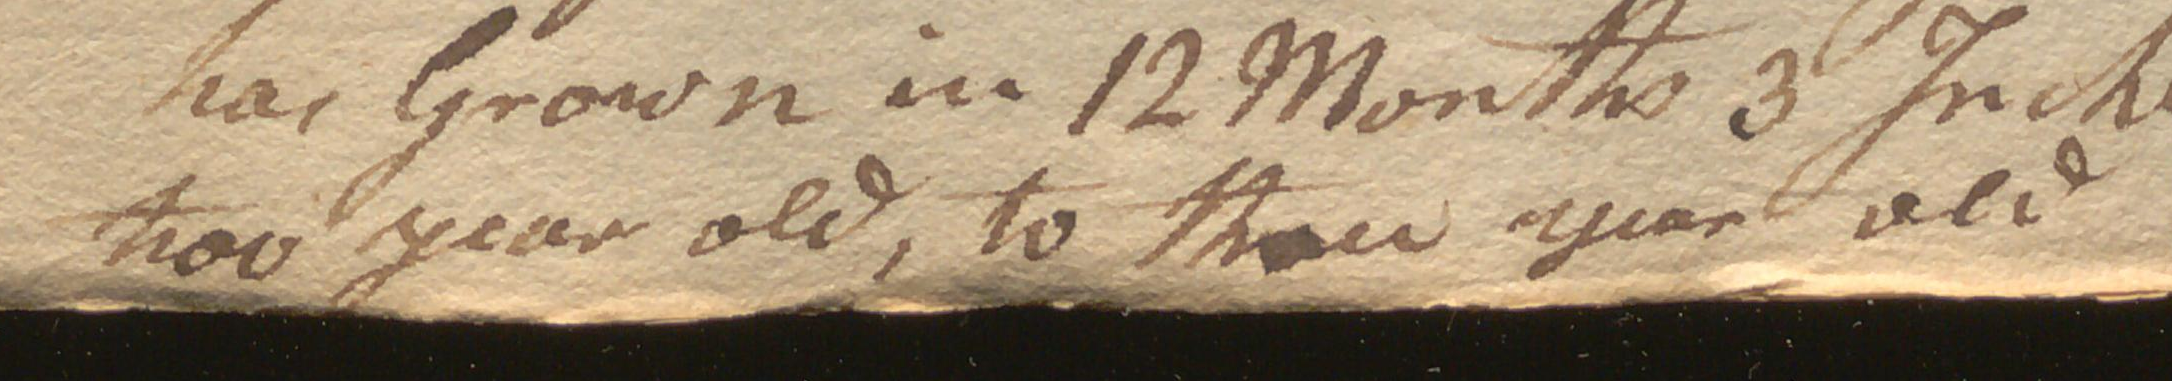two year old, to three year old
